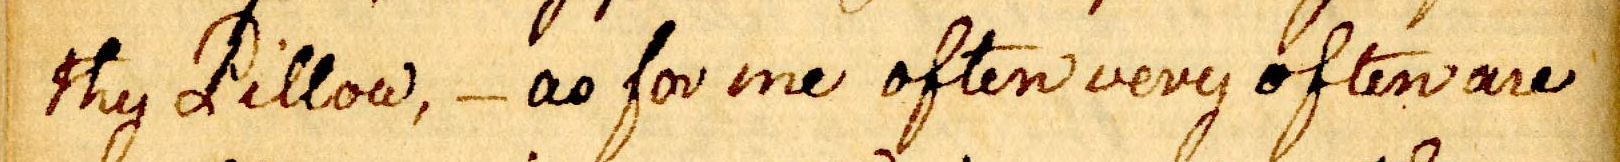thy Pillow,- as for me often very often are
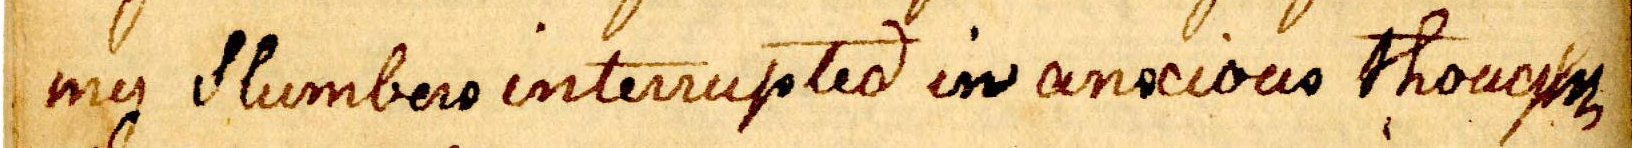my Slumbers interrupted in anxious thoughts
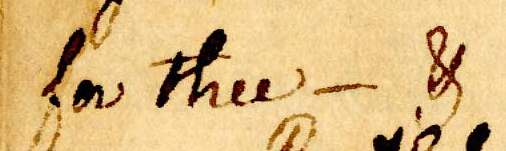for thee- &
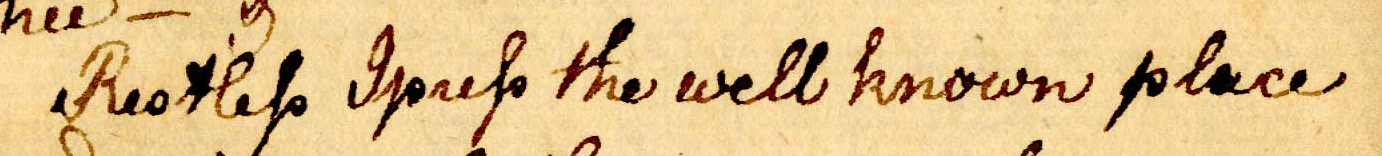Restless I press the well known place
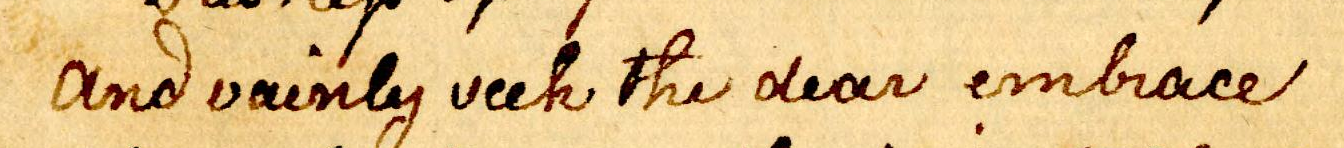And vainly seek the dear embrace
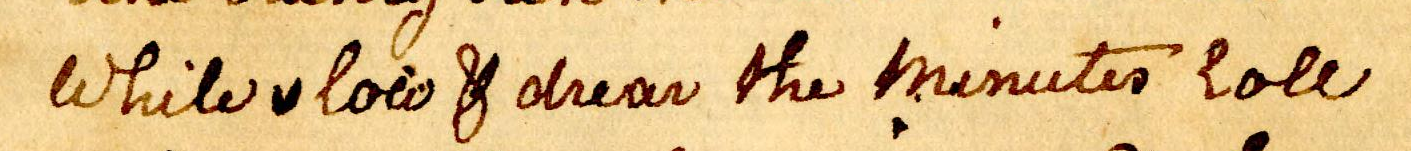While slow & drear the minutes [l]oll
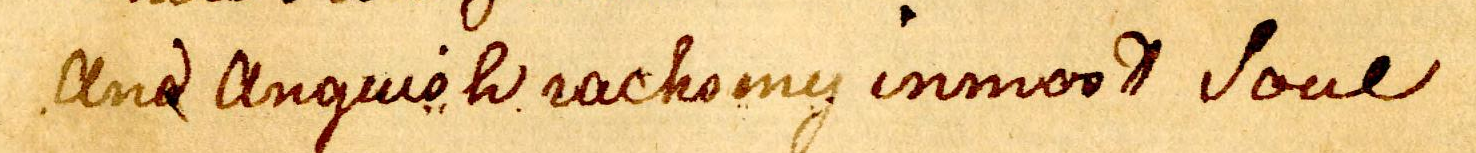And Anguish racks my inmost Soul
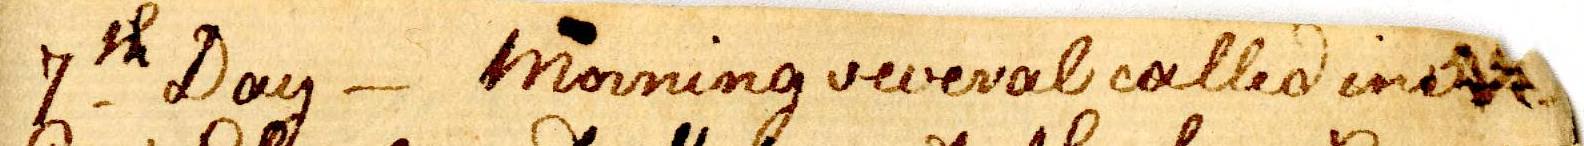7^th Day- Morning several called in
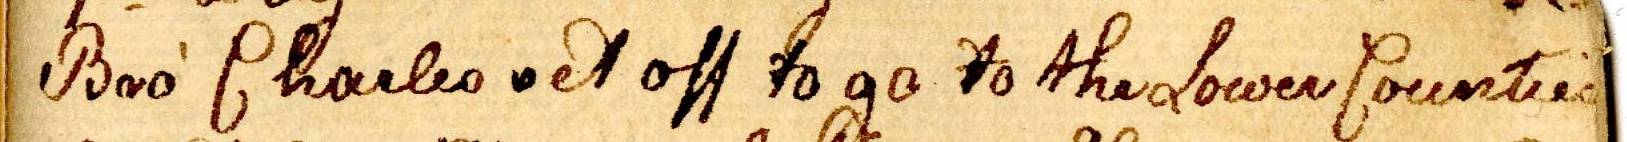Bro' Charles set off to go to the Lower Counties
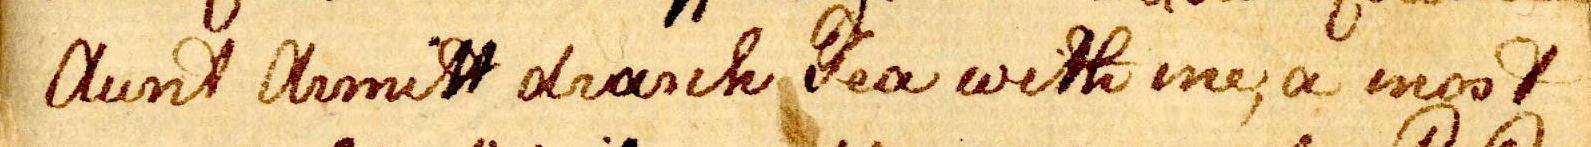Aunt Armitt drank Tea with me, a most
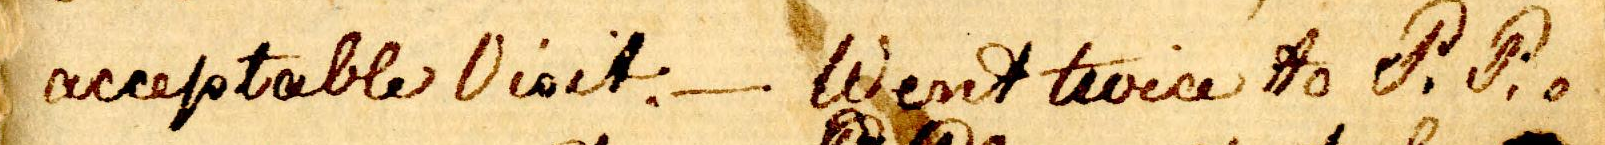acceptable Visit.- Went twice to P.P.s
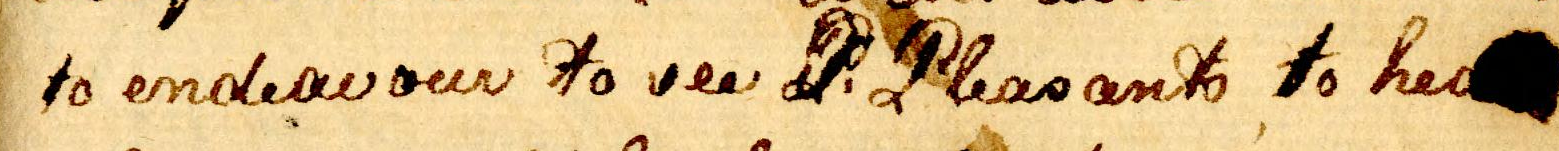to endeavour to see P. Pleasants to hea[_]
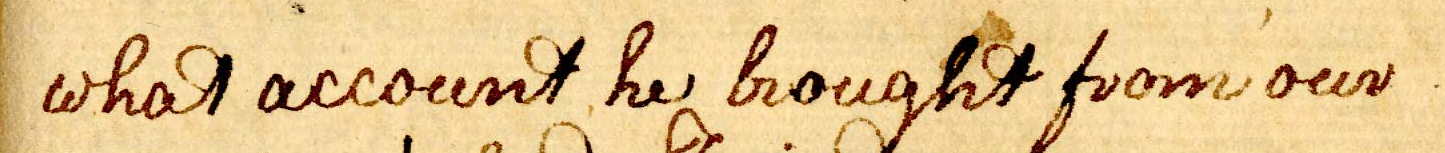what account he brought from our
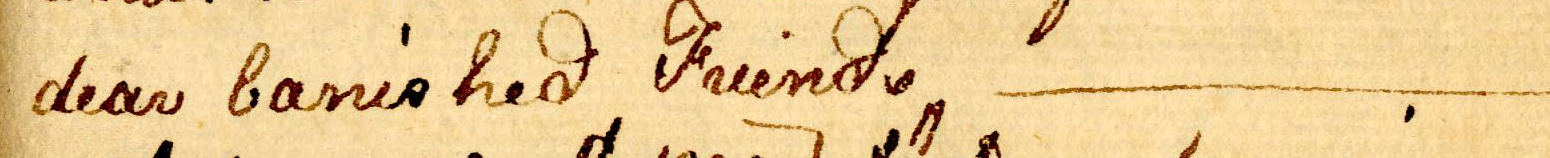dear banished Friends -
